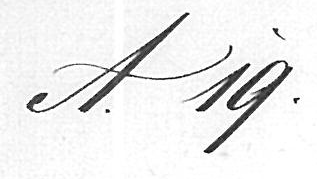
A. 19.
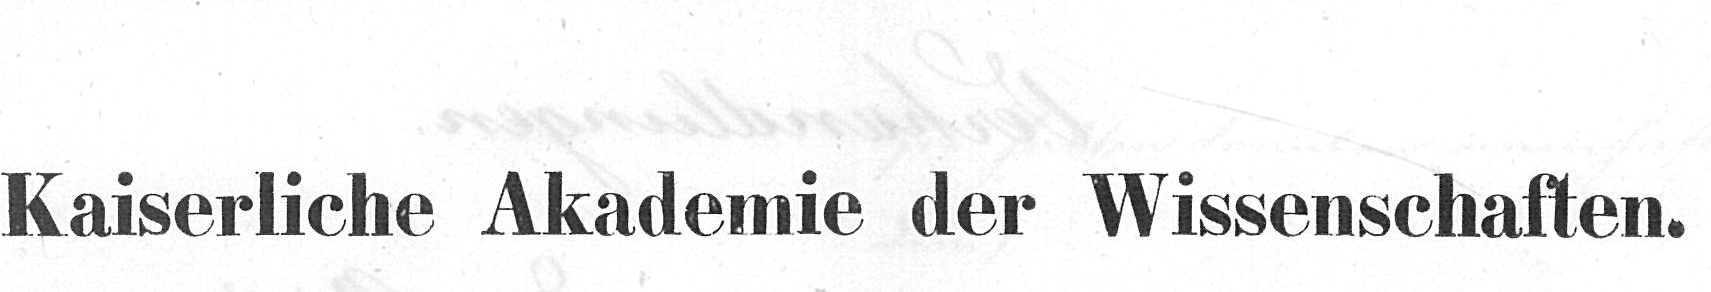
Kaiserliche Akademie der Wissenschaften.
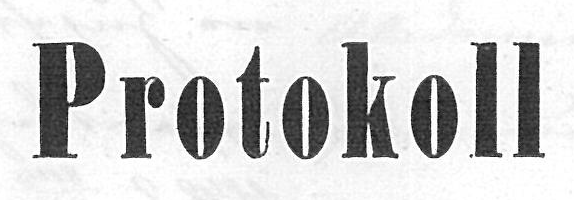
Protokoll
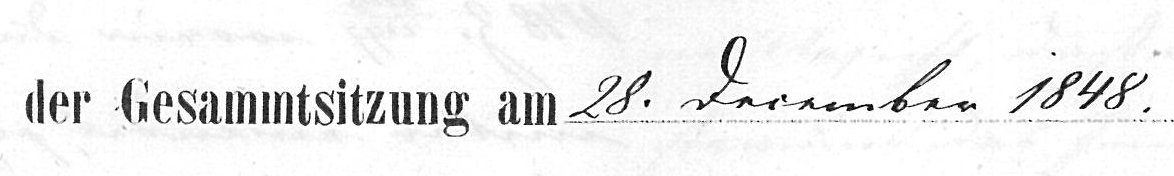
der Gesammtsitzung am 28. December 1848.
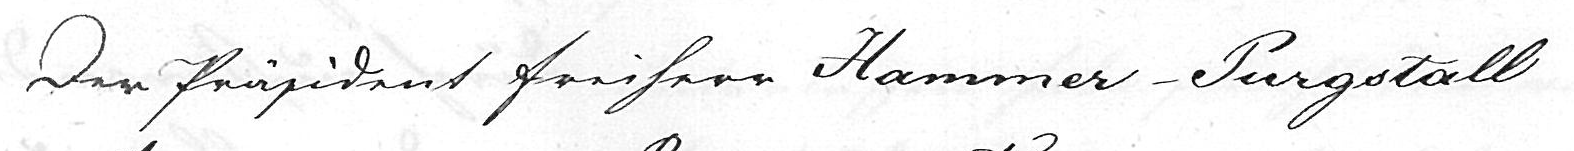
Der Präsident Freiherr Hammer-Purgstall
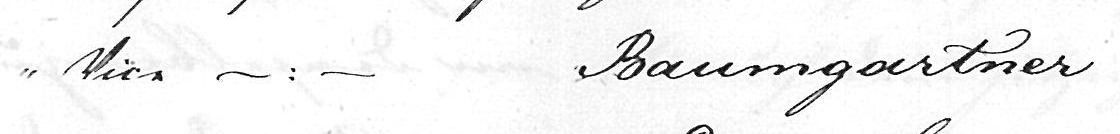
" Vice - - Baumgartner
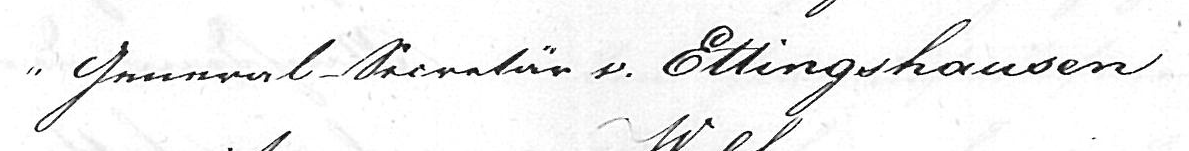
" General-Secretär v. Ettingshausen
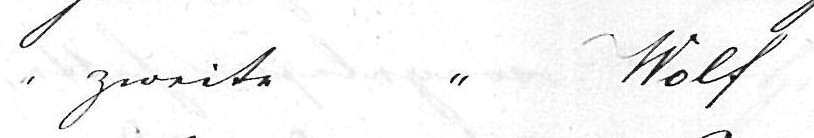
" zweite " Wolf
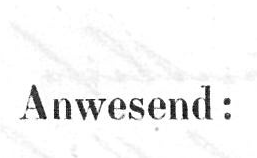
Anwesend:
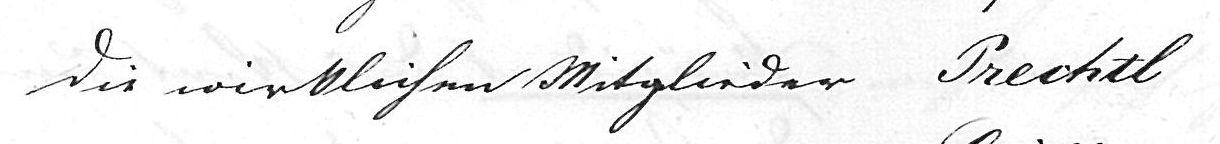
Die wirklichen Mitglieder Prechtl
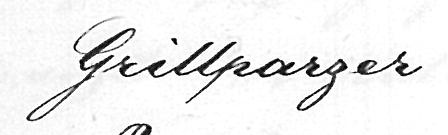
Grillparzer
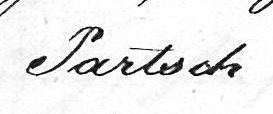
Partsch
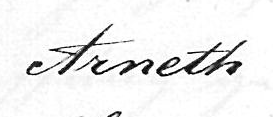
Arneth
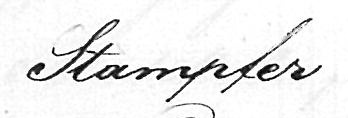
Stampfer
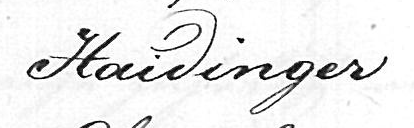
Haidinger
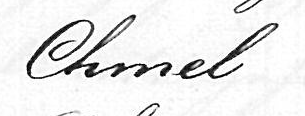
Chmel
